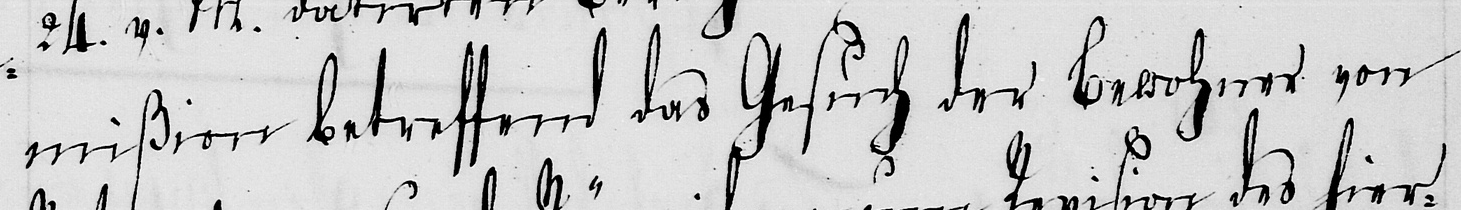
mißion betreffend das Gesuch der Bewohner von
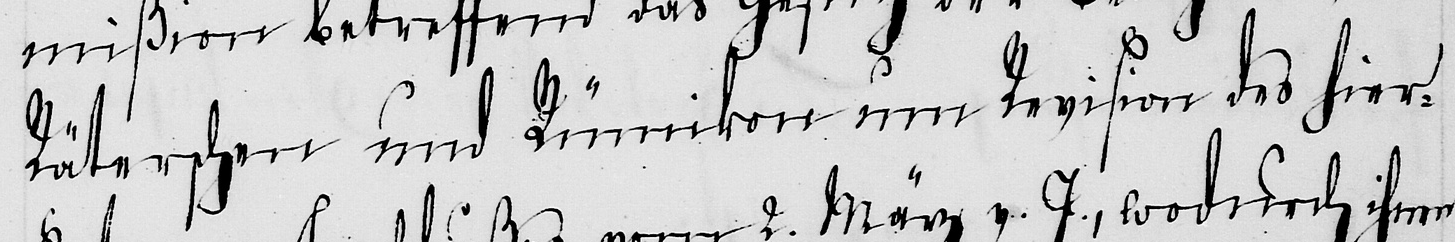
Räterschen und Rümikon um Revision des hier¬
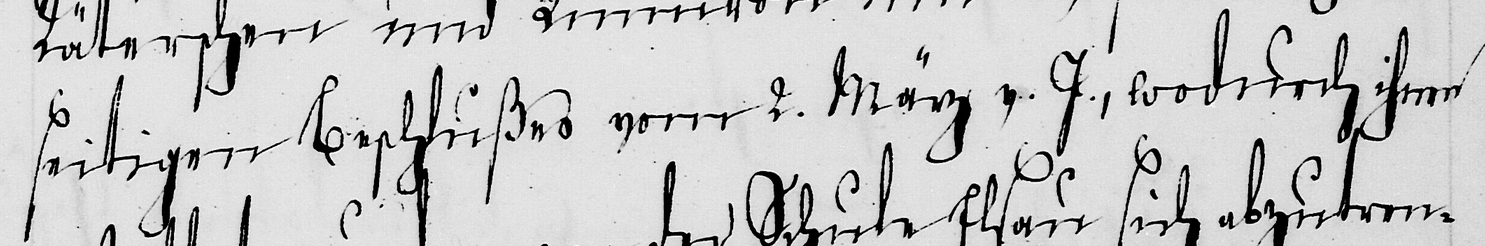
seitigen Beschlußes vom 2. März v. J., wodurch ihnen
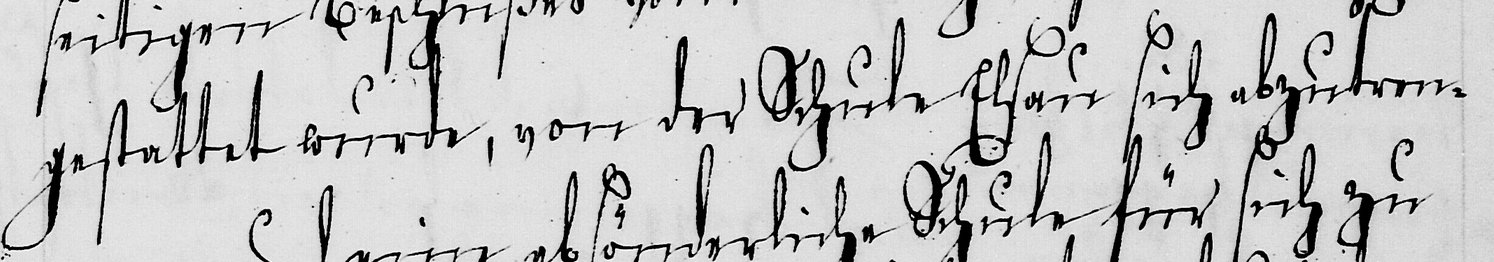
gestattet wurde, von der Schule Elsau sich abzutren¬
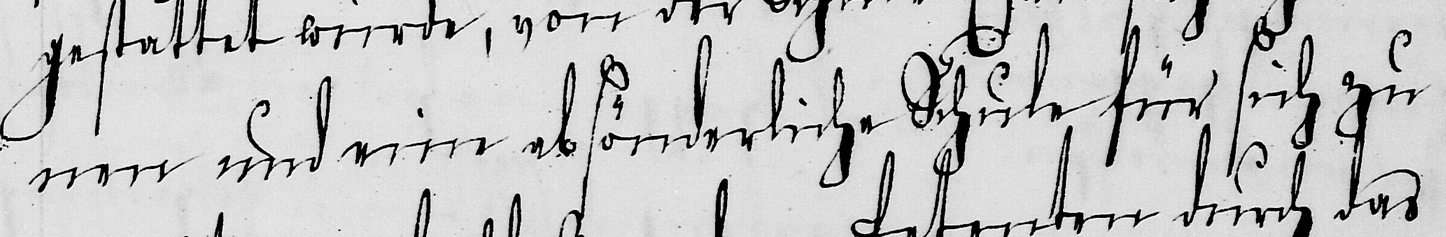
nen und eine absönderliche Schule für sich zu
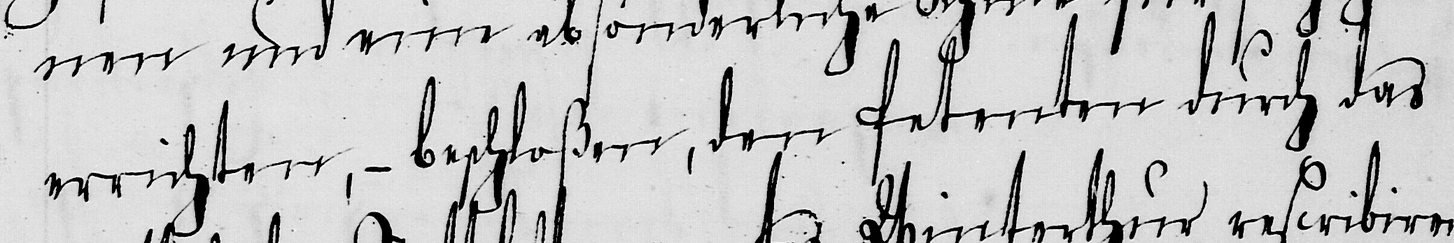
errichten, – beschloßen, den Petenten durch das
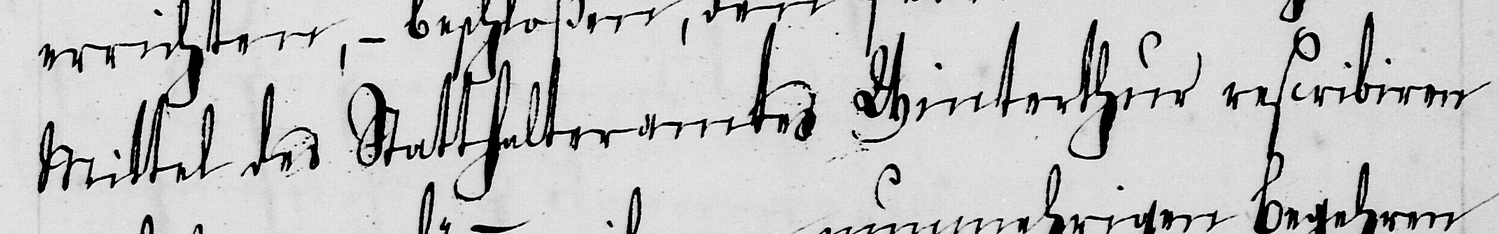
Mittel des Statthalteramtes Winterthur rescribiren
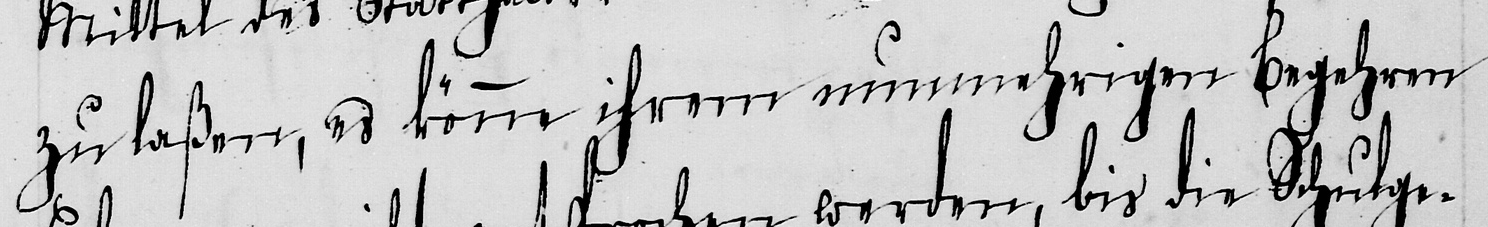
zu laßen, es könne ihrem nunmehrigen Begehren
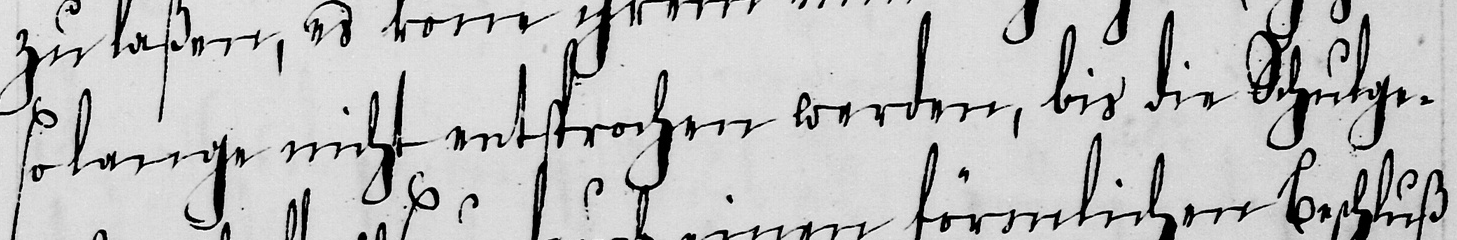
solange nicht entsprochen werden, bis die Schulge¬
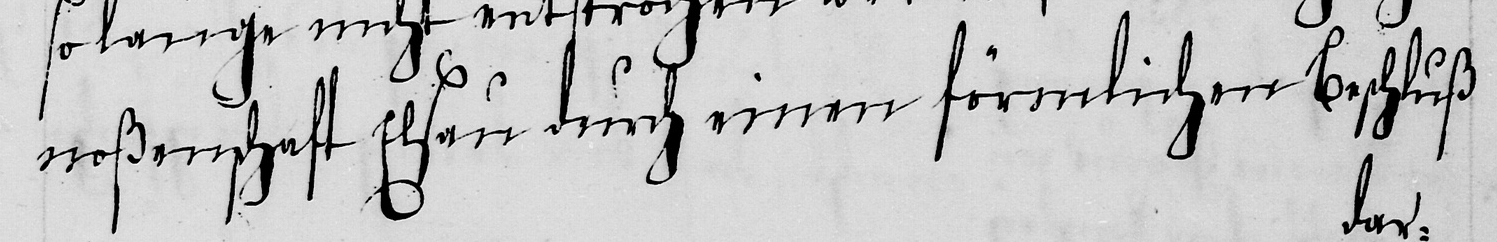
noßenschaft Elsau durch einen förmlichen Beschluß
